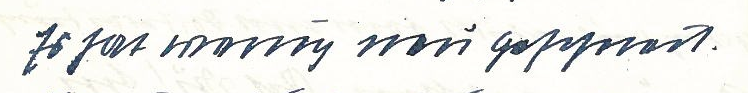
Es hat wenig neu geschneit.
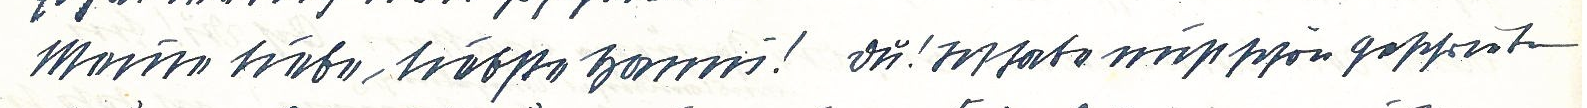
Meine liebe, liebste! Du! Ich habe nicht schön geschrieben
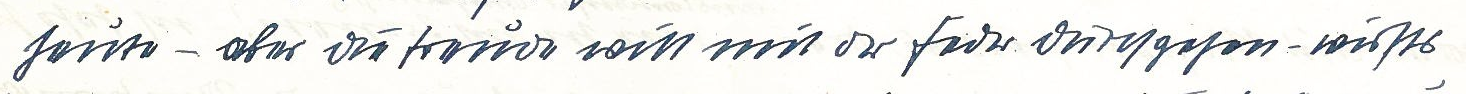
heute – aber die Freude will mit der Feder durchgehen – wirsts
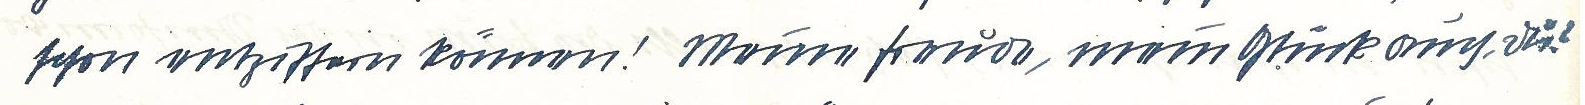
schon entziffern können! Meine Freude, mein Glück auch, Du!
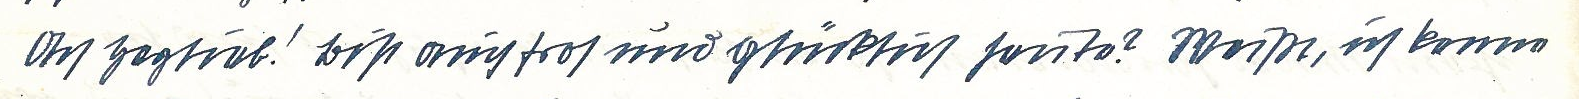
Ach Herzlieb! Bist auch froh und glücklich heute? Weißt, ich kenne
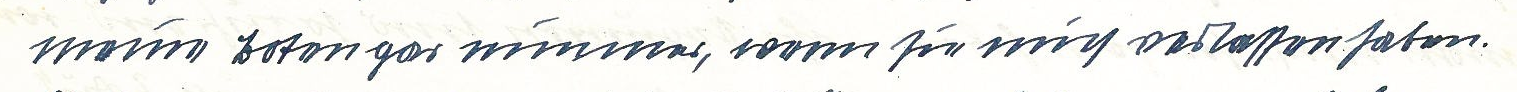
meine Boten gar nimmer, wenn sie mich verlassen haben.
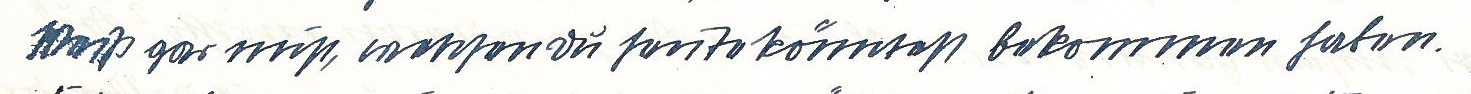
Weiß gar nicht, welchen Du heute könntest bekommen haben.
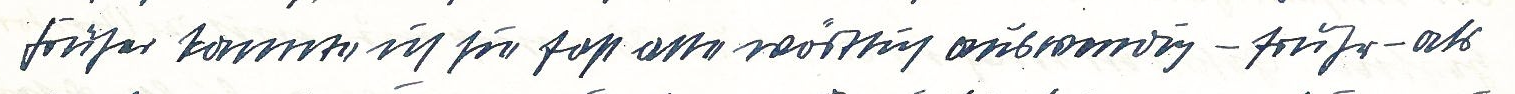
Früher kannte ich sie fast alle wörtlich auswendig – früher – als
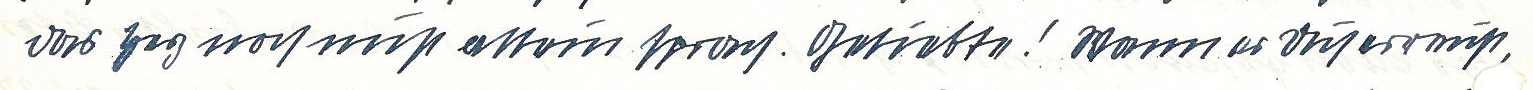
das Herz noch nicht allein sprach. Geliebte! Wenn er Dich erreicht,
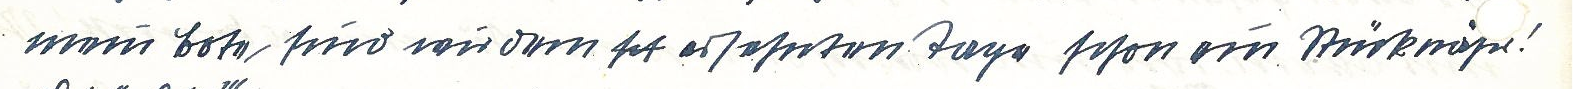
mein Bote, sind wir dem erwähnten fet Tage schon ein Stück nher!
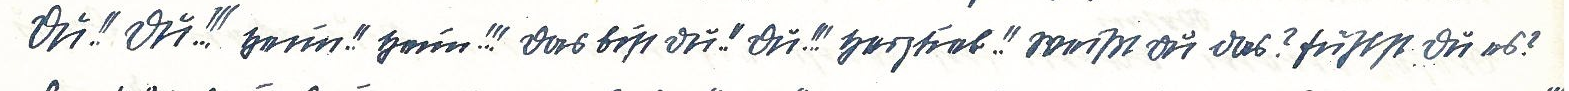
Du!! Du!!! Heim!! Heim!!! Das bist Du!! Du!!! Herzlieb!! Weißt Du das? Fühlst Du es?
